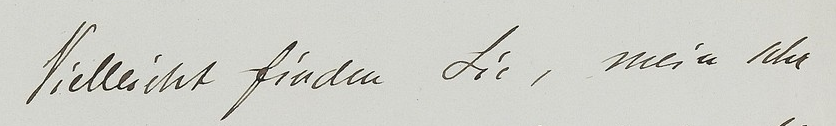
Vielleicht finden Sie, mein sehr
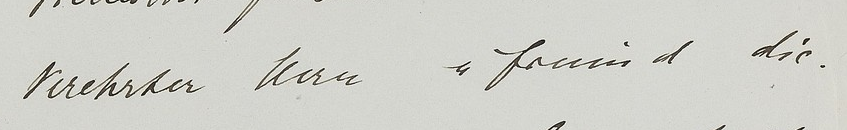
verehrter Herr u Freund die-
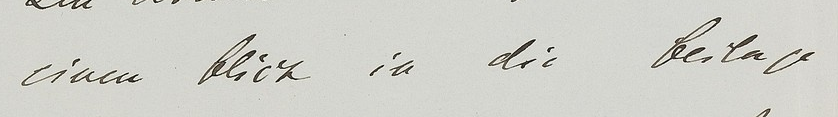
einen Blick in die Beilage
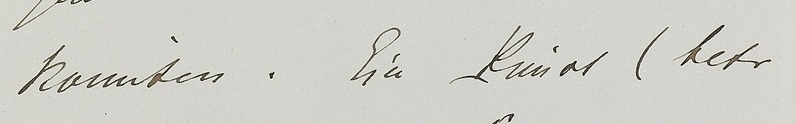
könnten. Ein Punct (betr
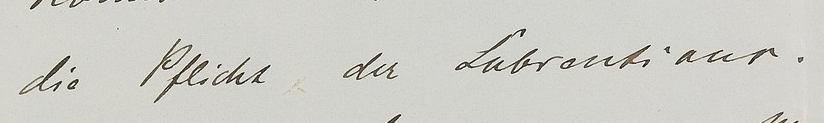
die Pflicht der Subventions-
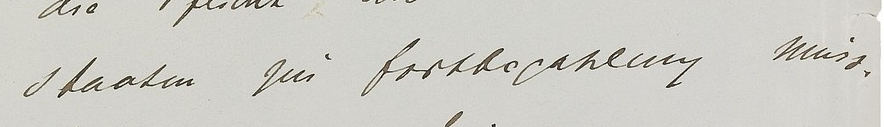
staaten zur Fortbezahlung müss-
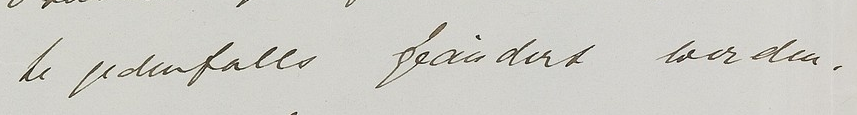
te jedenfalls geändert werden.
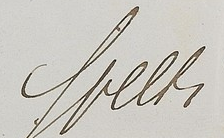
E Welti
